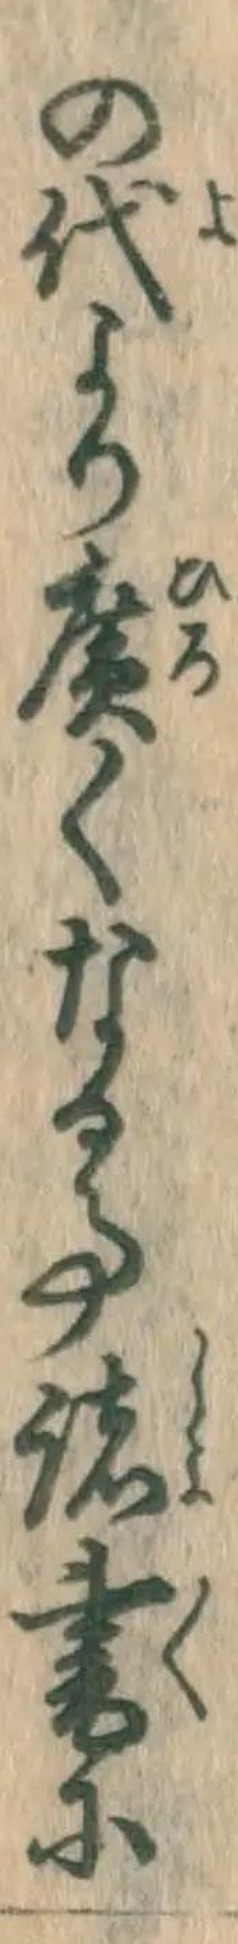の代より広くなる事諸書に
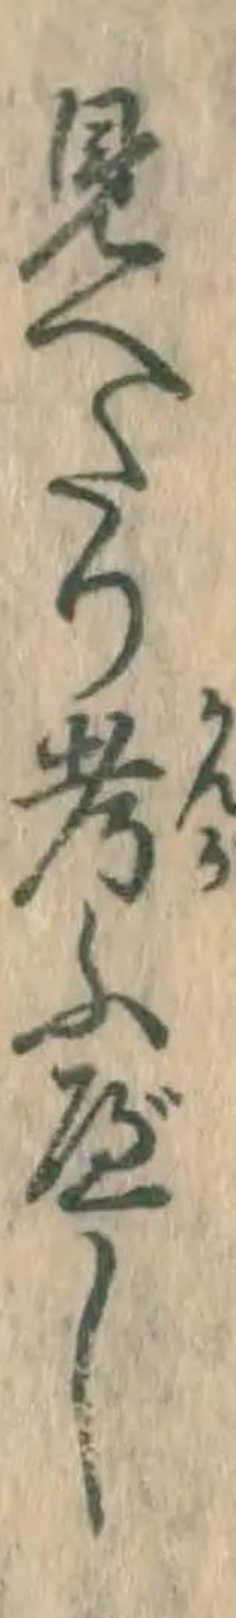見へたり考ふべし
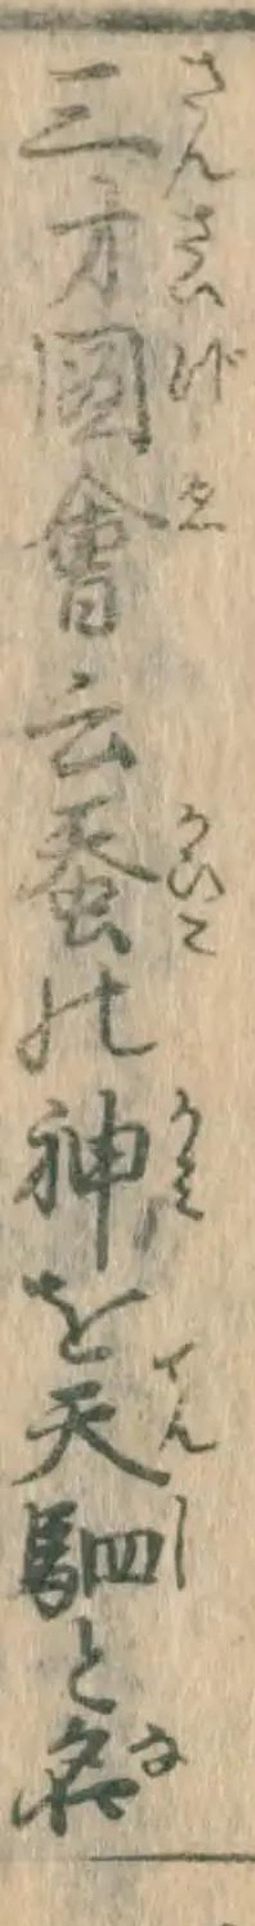三才図会云蚕の神を天駟と名
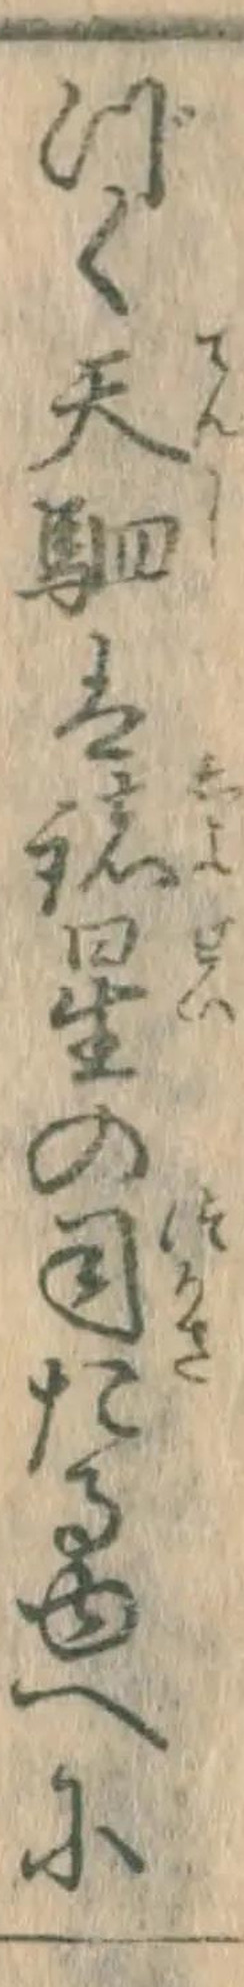づく天駟は諸星の司たるゆへに
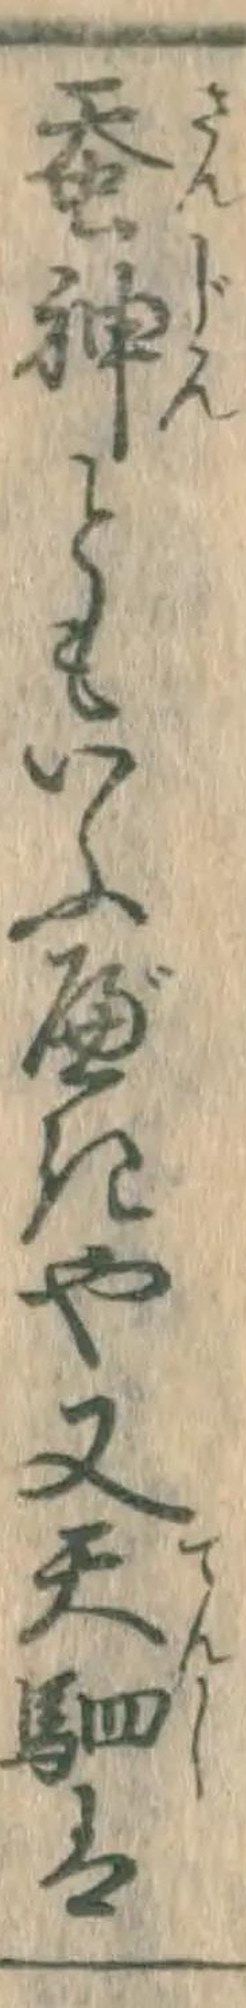蚕神ともいふべきや又天駟は
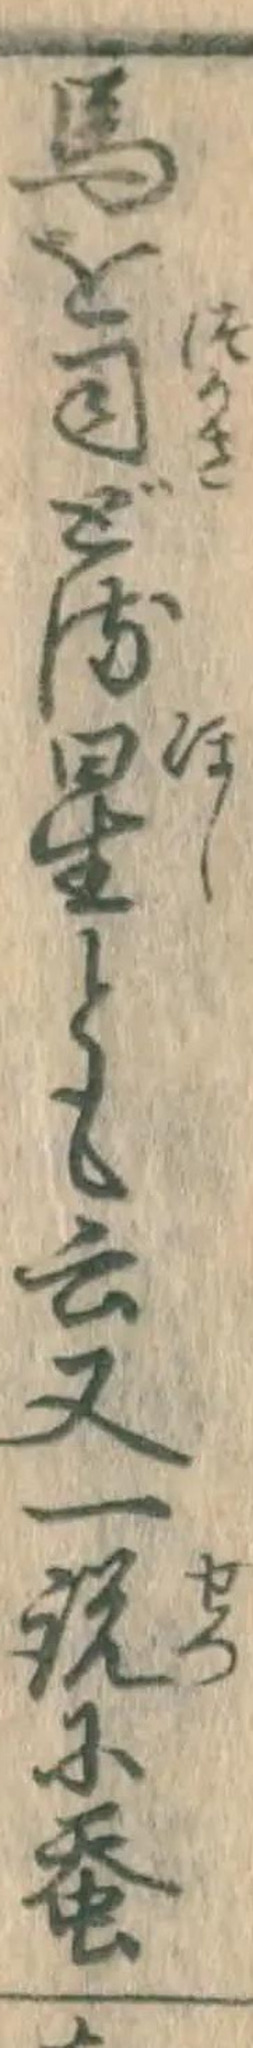馬を司どる星とも云又一説に蚕
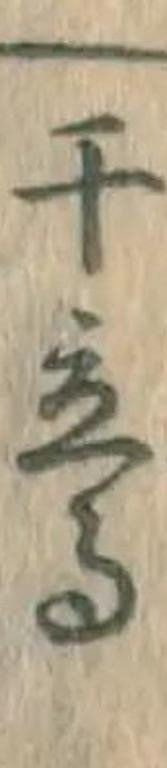干立る
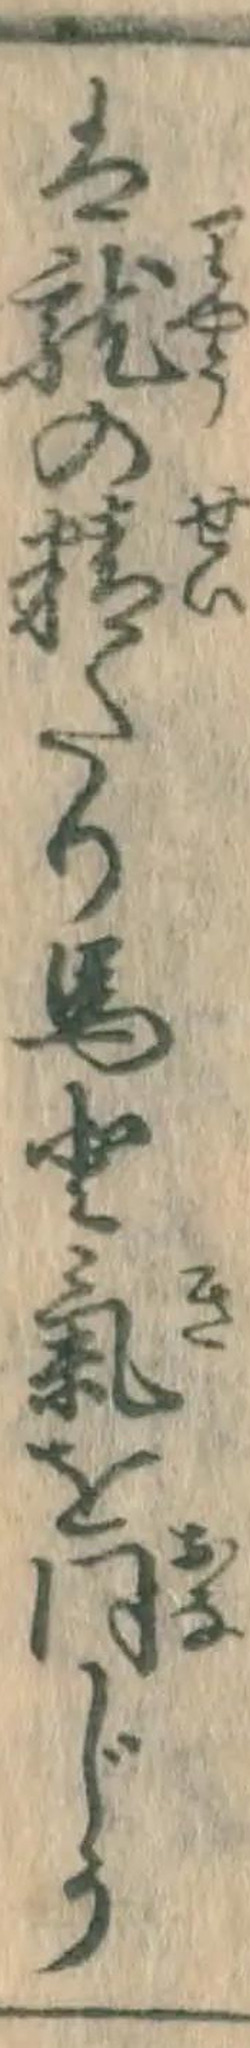は龍の精たり馬と気を同じう
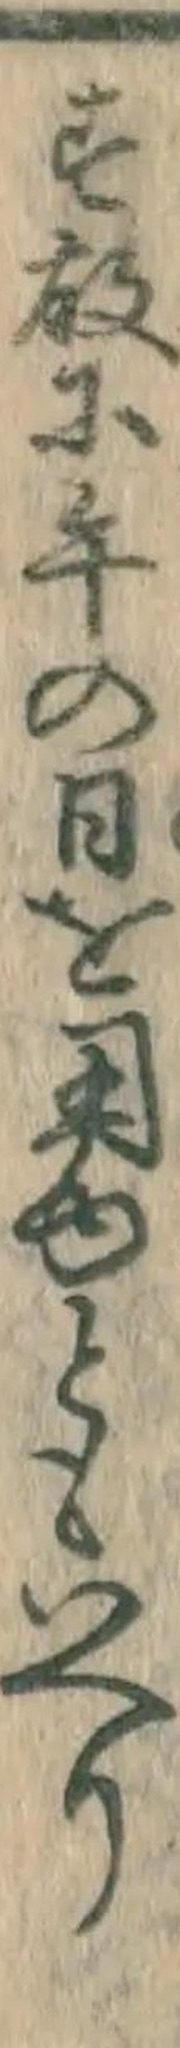す故に午の日を用ゆともいへり

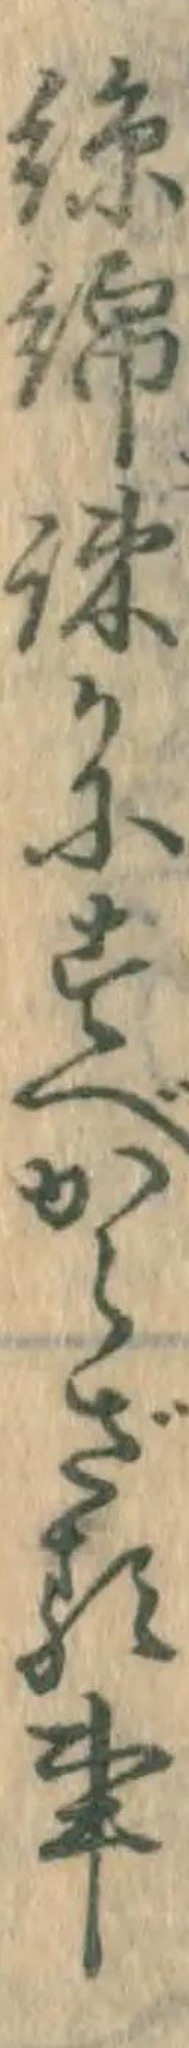糸綿疎かにすべからざる事
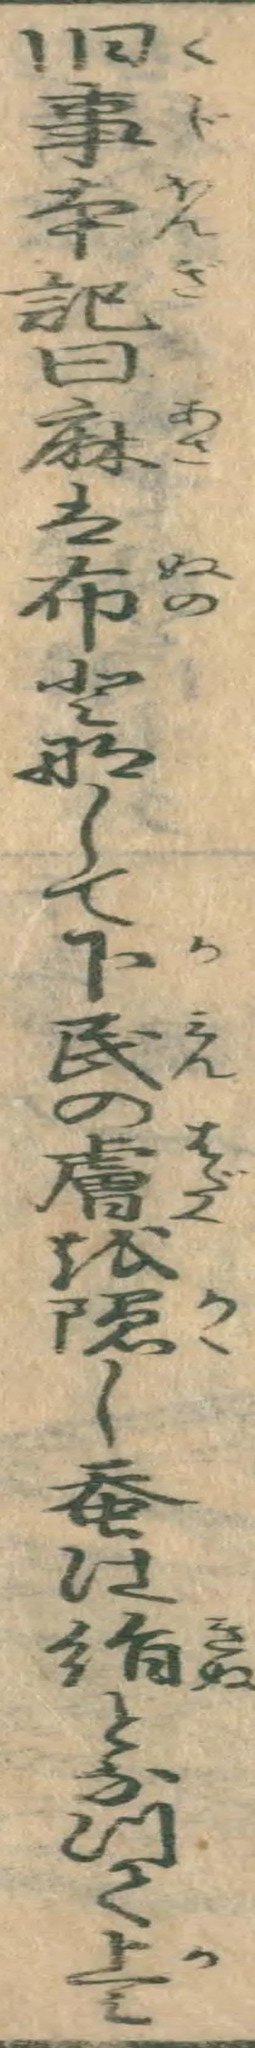旧事本記曰麻は布となして下民の膚を隠し蚕は絹となつて上み
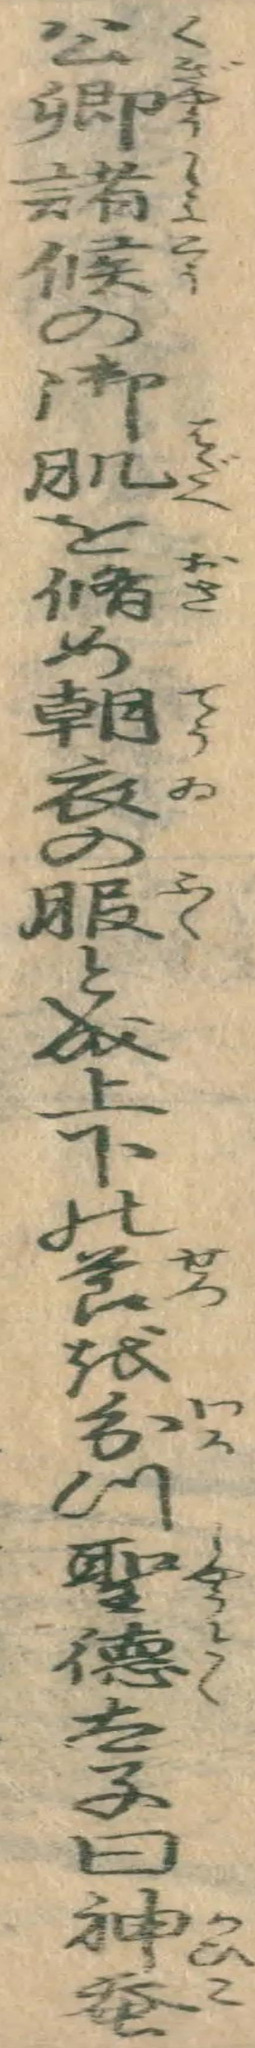公卿諸侯の御肌を修め朝衣の服と成上下の節を分つ聖徳太子曰神蚕
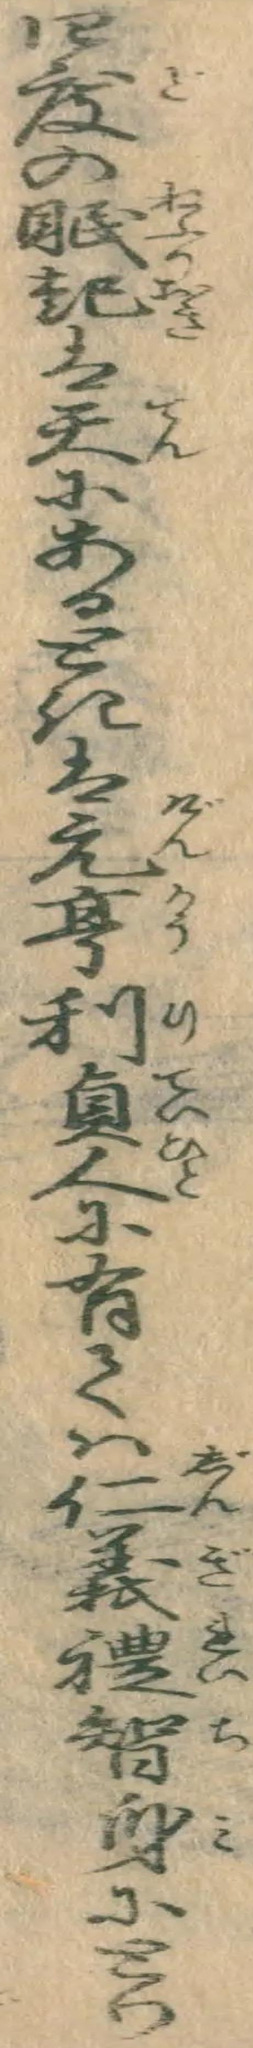四度の眠起は天にあるときは元亨利貞人に有ては仁義禮智身にとり
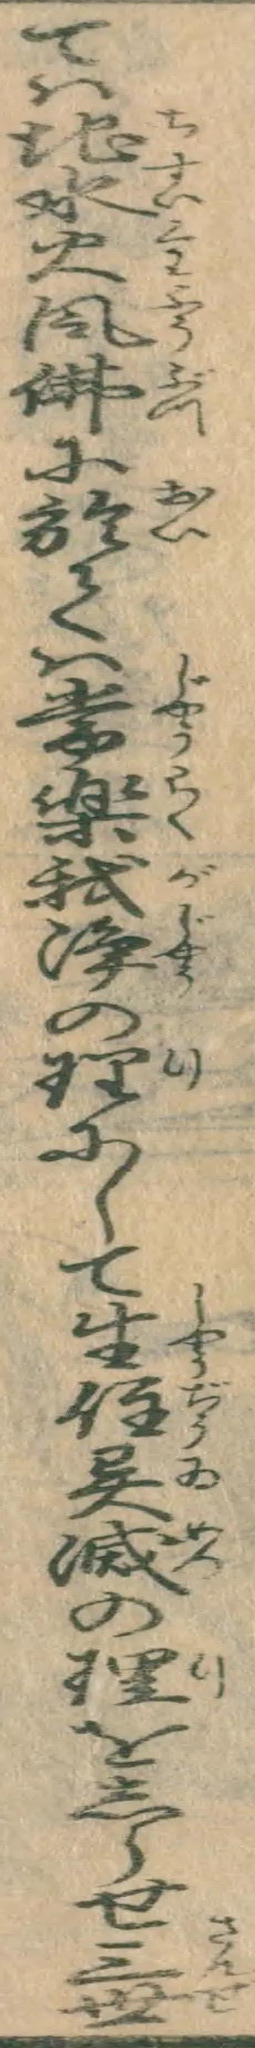ては地水火風仏に於ては常楽我浄の理にして生住異滅の理をしらせ三世
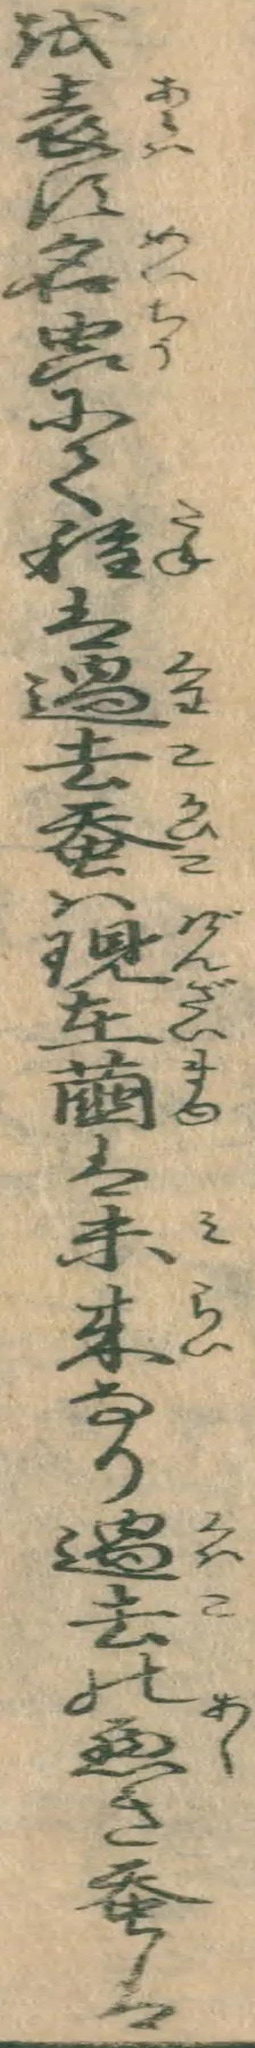を表す名虫にて種は過去蚕は現在繭は未来なり過去の悪き蚕は
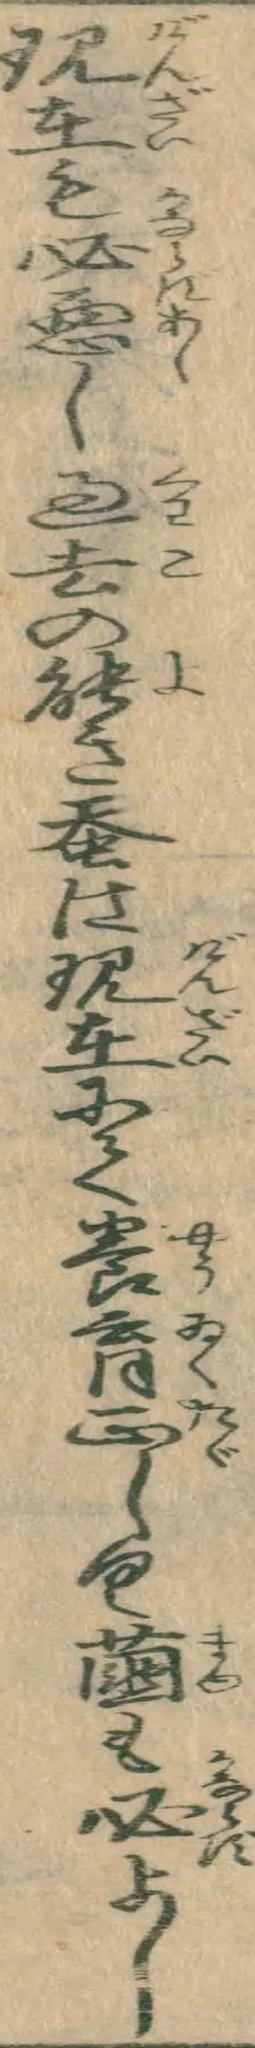現在も必悪し過去の能き蚕は現在にて養育正しく繭も必よし
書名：養蚕秘録 3巻. [3]
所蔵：国立国会図書館 National Diet Library, JAPAN
